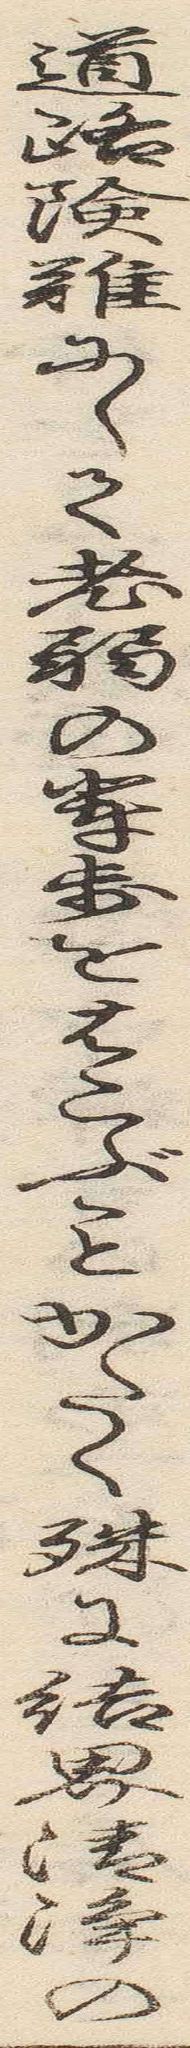道路険難にして老弱の輩歩をはこぶことかたく殊に結界清浄の
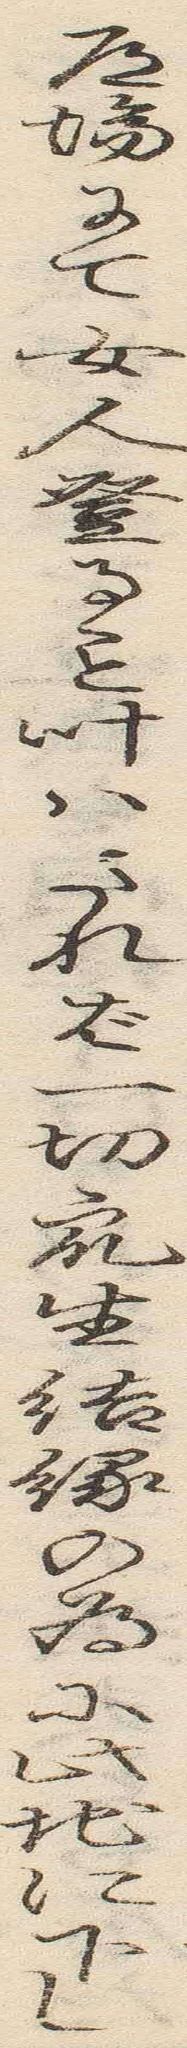道塲にて女人登ること叶はされば一切衆生結緣の為に此地に下し
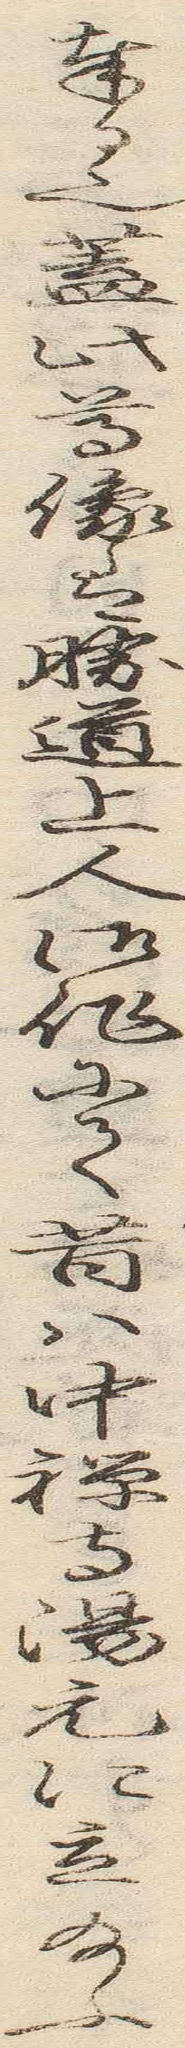奉る也蓋此尊像は勝道上人御作にて昔は中禅寺湯本に立給ふ
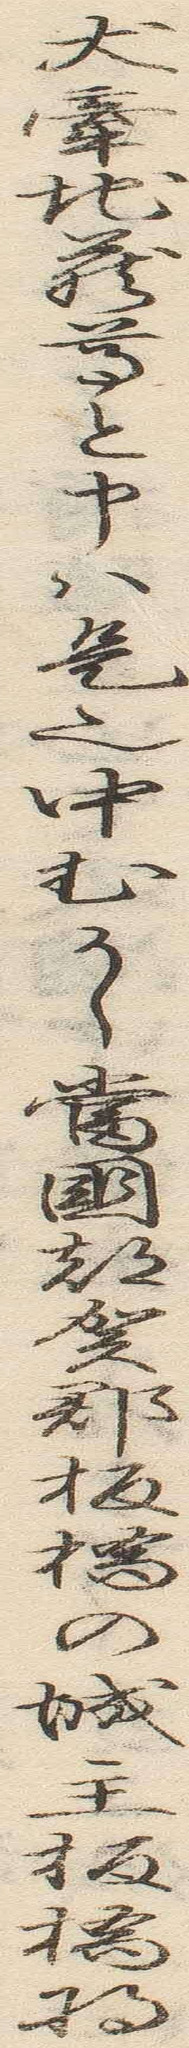犬牽地蔵尊と申は是也中むかし當國都賀郡板橋の城主板橋将
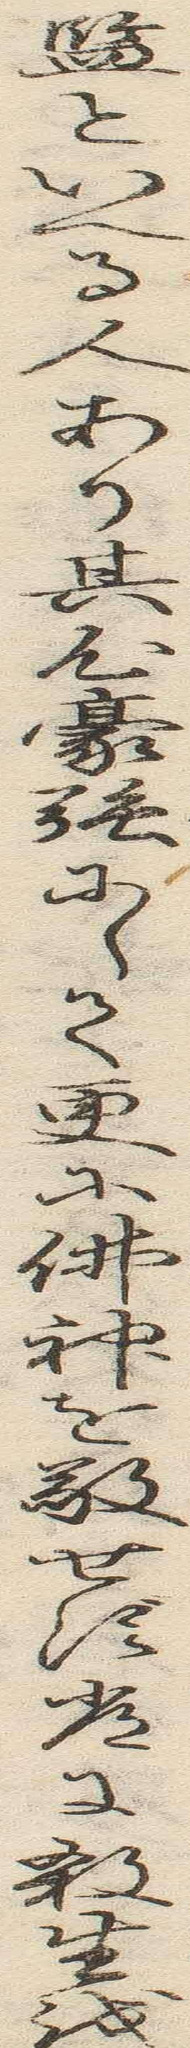監といへる人あり其心豪強にして更に佛神を敬せず常に殺生を
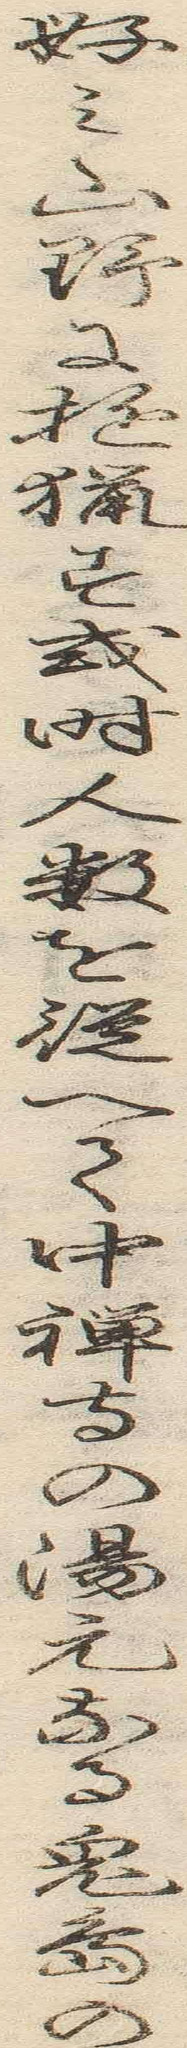好み山野に逰猟す或时人数を従へて中禅寺の湯本なる兎島の
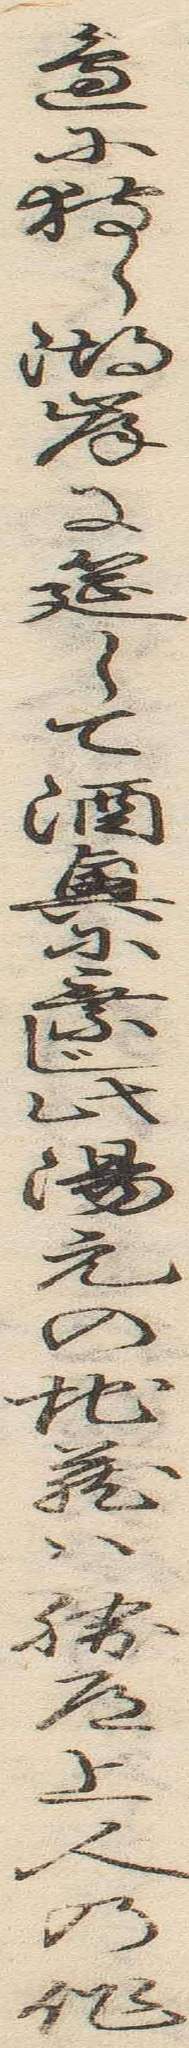邊に狩し湖岸に筵して酒興に乗じ此湯本の地蔵は勝道上人の作
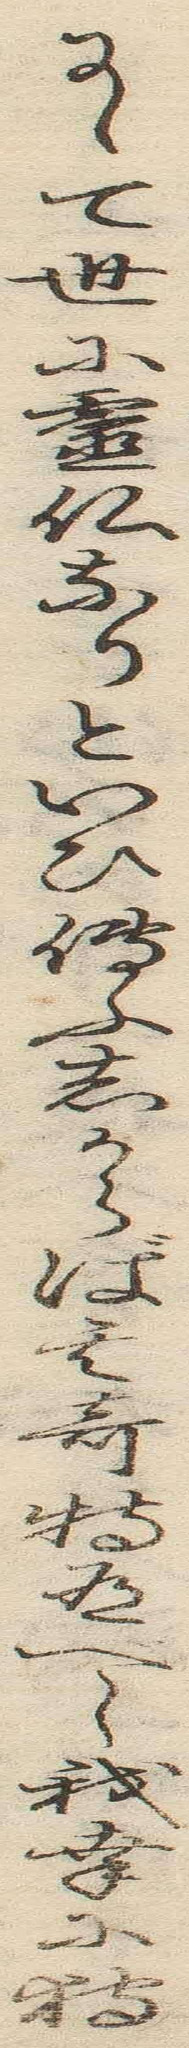にして世に靈仏なりといひ傳ふしからば其奇特有べし我幸に狩
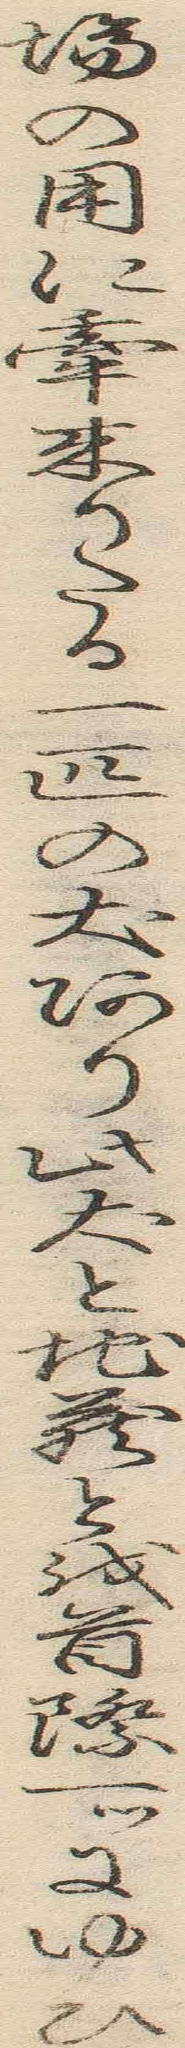塲の用に牽來りたる一匹の犬あり此犬と地蔵とを首際一ッにゆひ
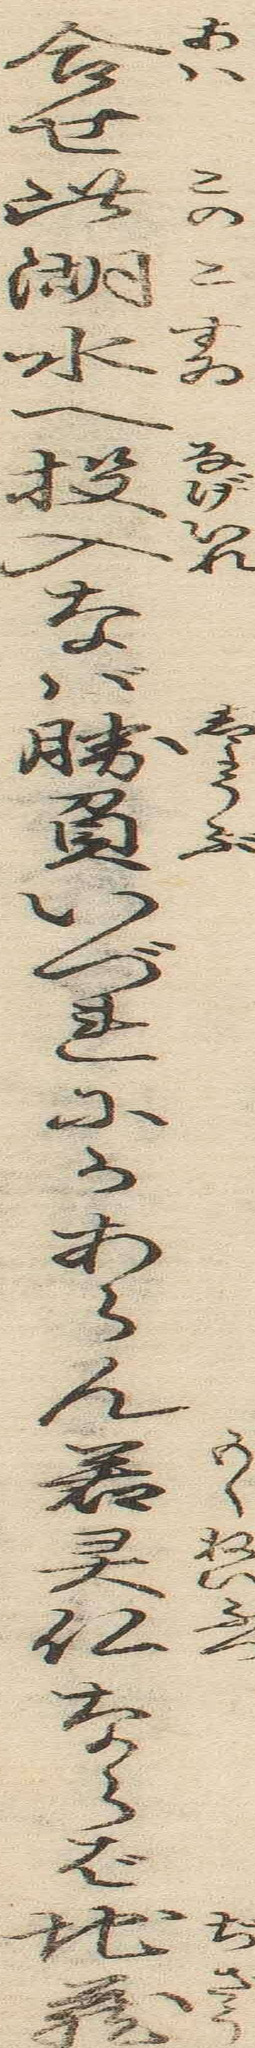合せ此湖水へ投入なば勝負いづれにかあらん若㚑仏ならば地蔵

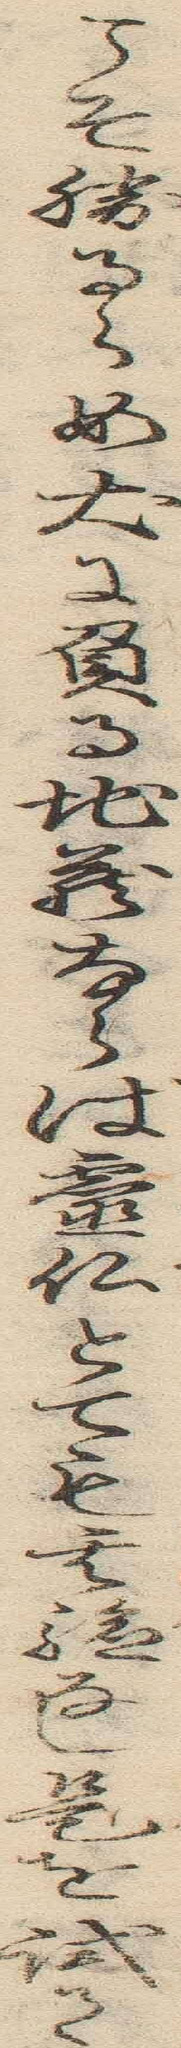こそ勝るらめ犬に負る地蔵ならば靈仏とても其話なし是を試て
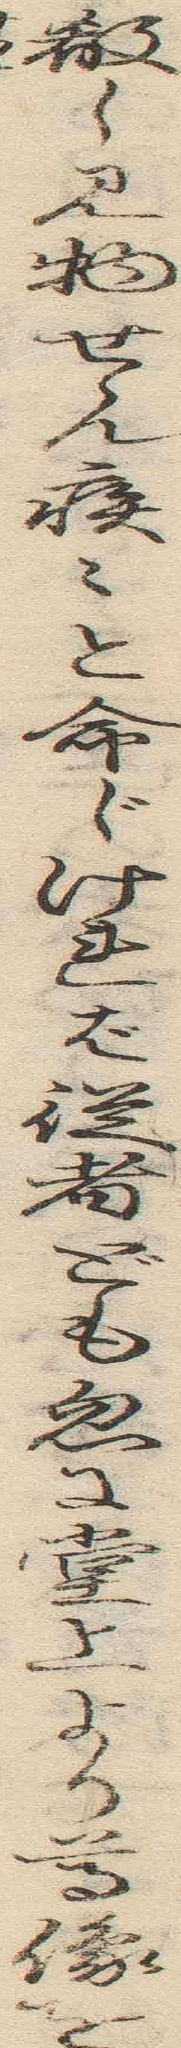殽し見物せん疾〻と命じければ従者ども忽に堂上より尊像を
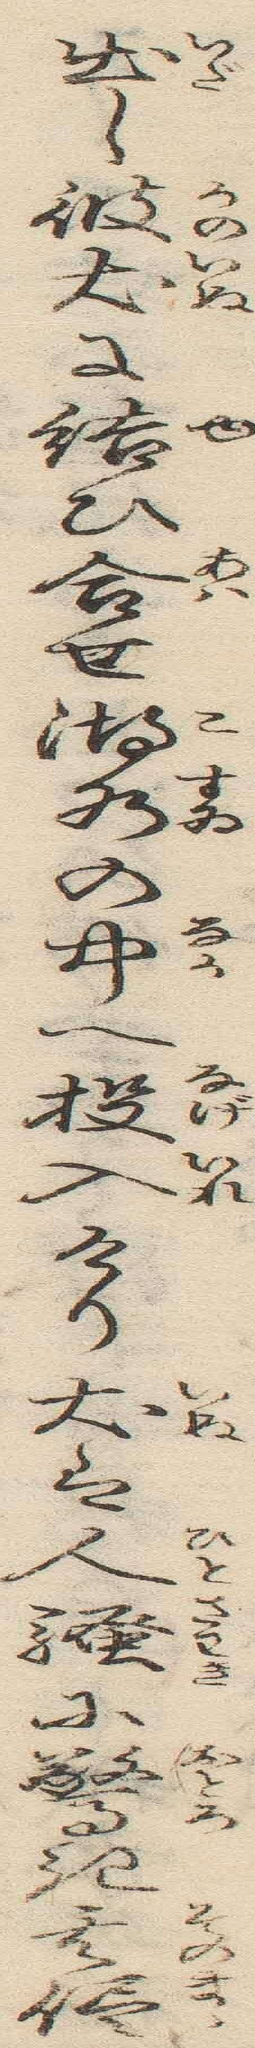出し彼犬に結ひ合せ湖水の中へ投入けり犬は人騒に驚き其侭
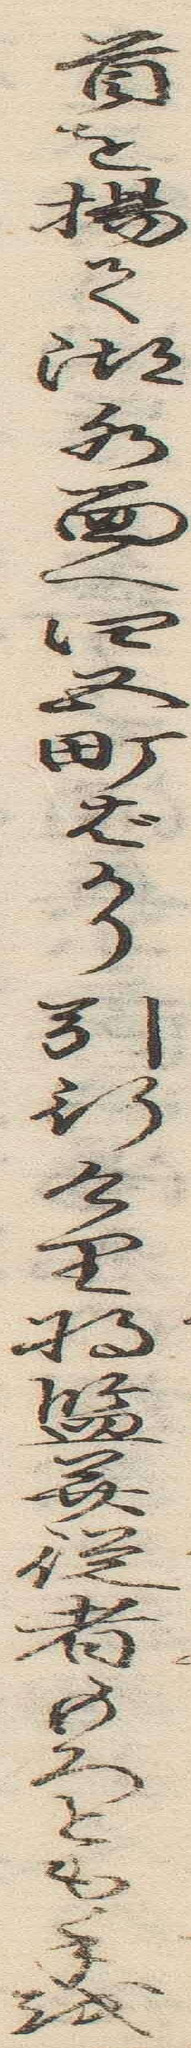首を揚て湖水面へ四五町ばかり引行けり将監并従者もろとも手を
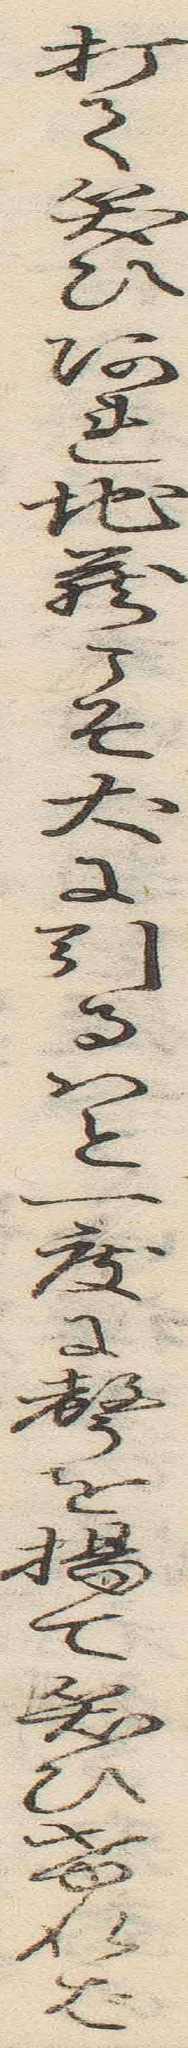打て笑ひあれ地蔵こそ犬に引るはと一度に聲を揚て笑ひければ
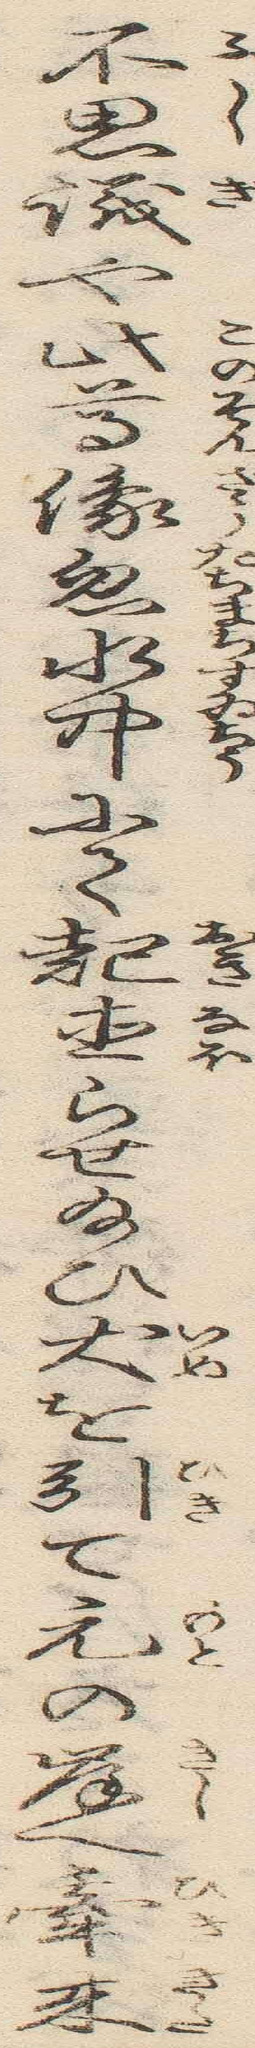不思議や此尊像忽水中にて起直らせ給ひ犬を引て元の岸へ牽來
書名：日光山志
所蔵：東京学芸大学附属図書館 国文学研究資料館
